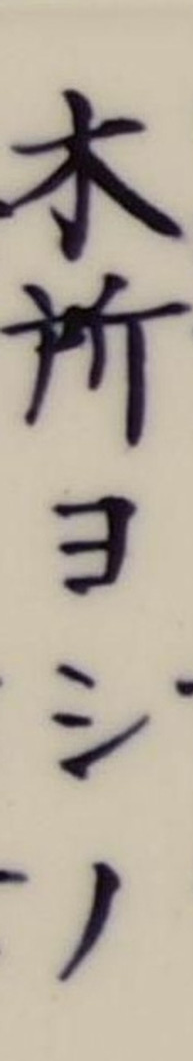木所ヨシノ
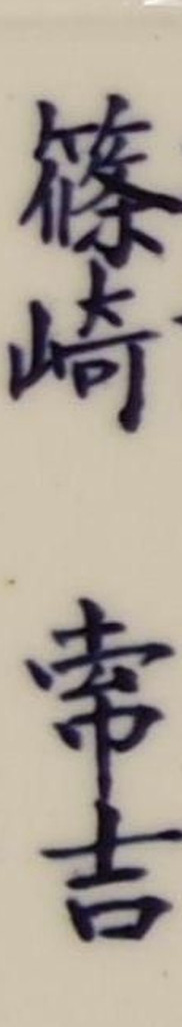篠崎常吉

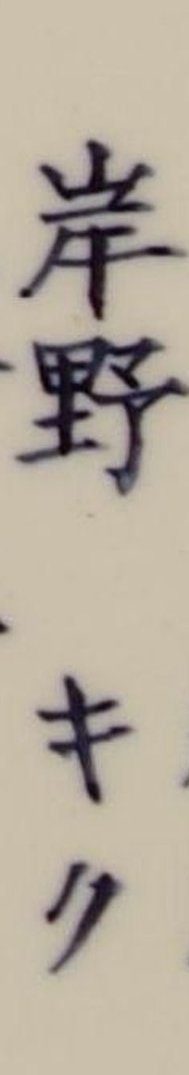岸野キク
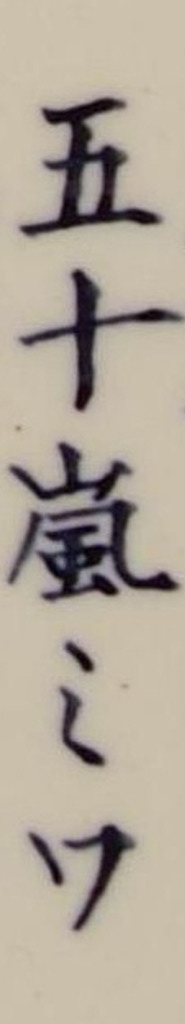五十嵐ミワ
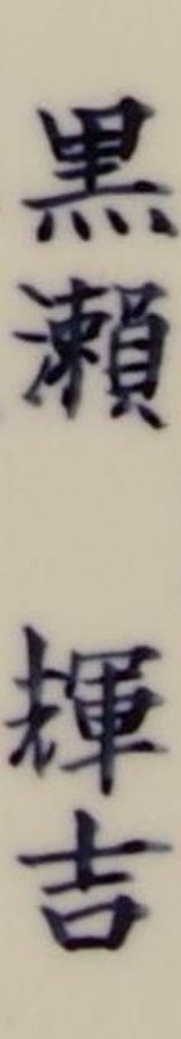黒瀬輝吉
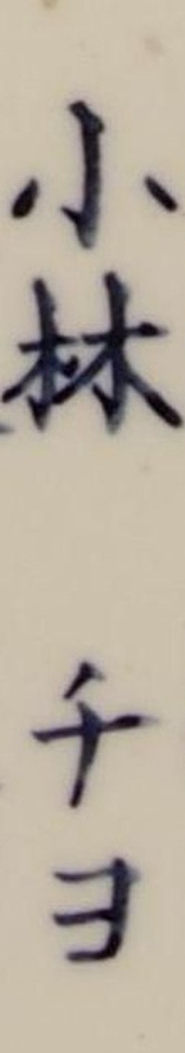小林チヨ
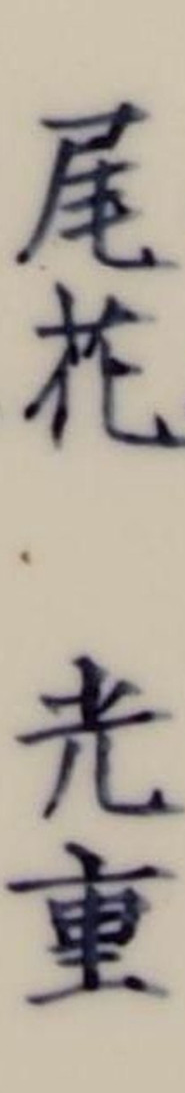尾花光重
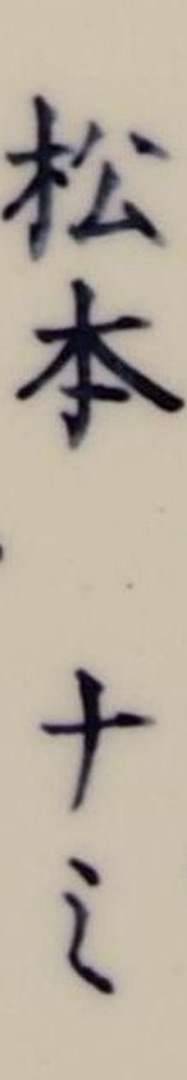松本ナミ
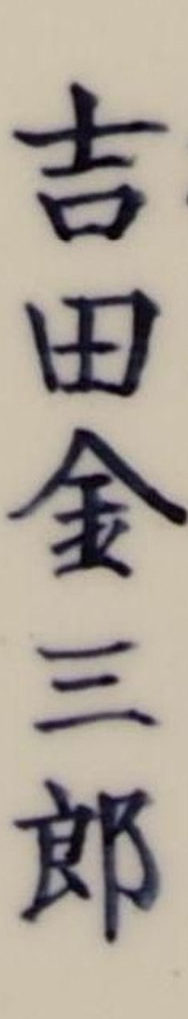吉田金三郎
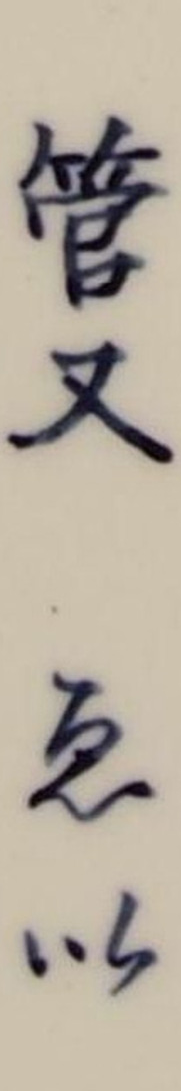管又ゑい
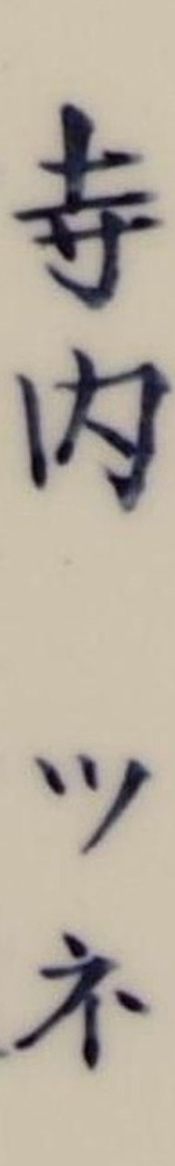寺内ツネ
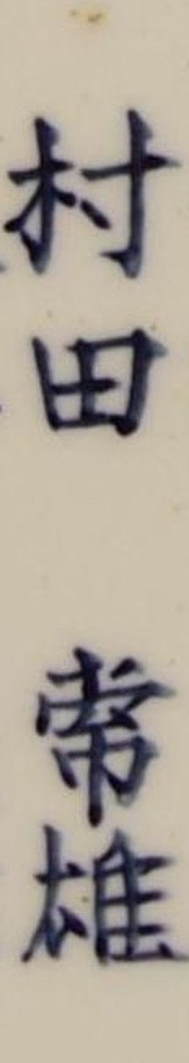村田常雄
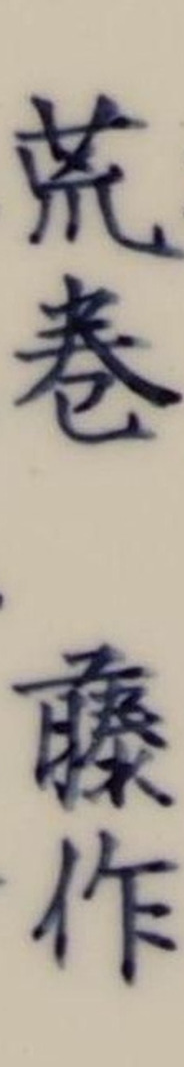荒巻藤作
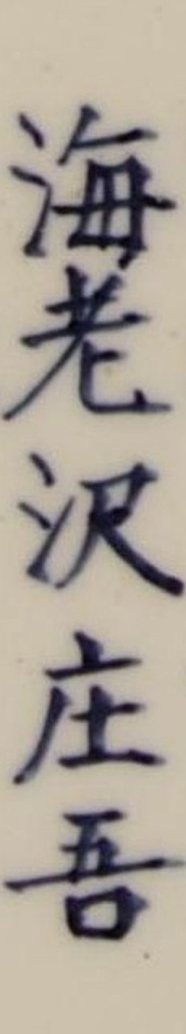海老沢庄吾
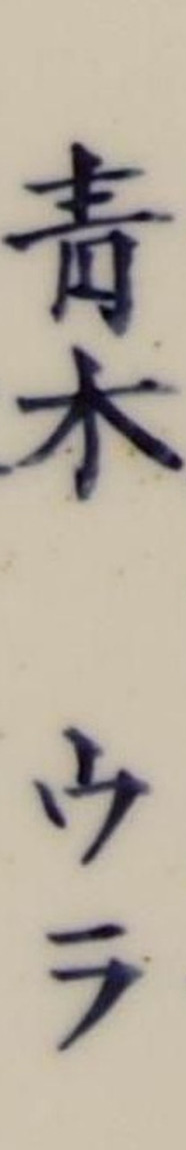青木ウラ
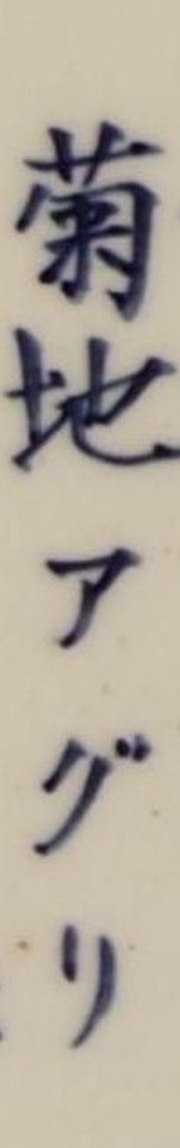菊地アグリ
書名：E~L
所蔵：高野山金剛峯寺
